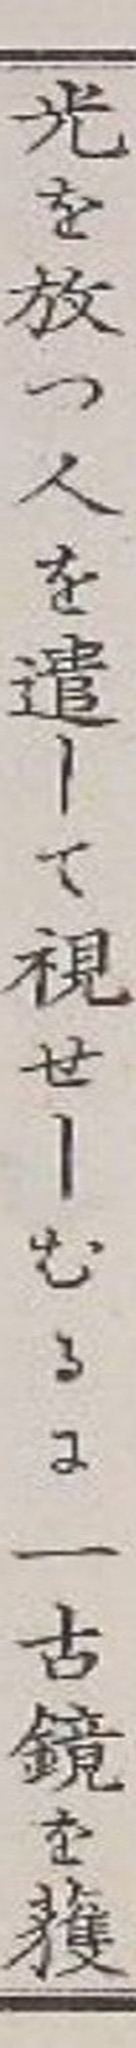光を放つ人を遣して視せしむるに一古鏡を獲
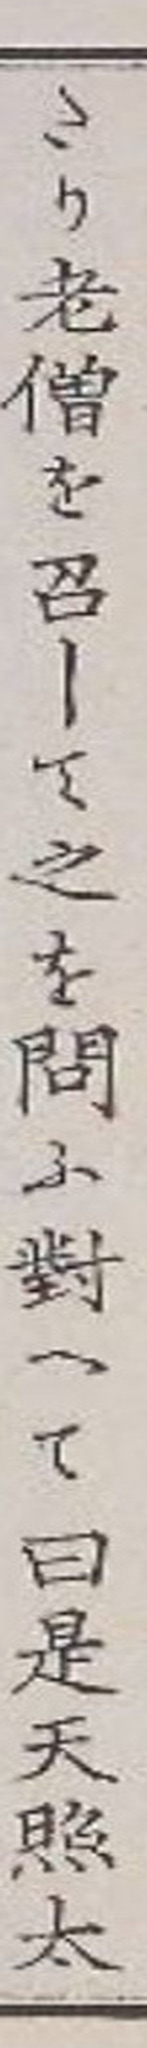たり老僧を召して之を問ふ対へて曰是天照太
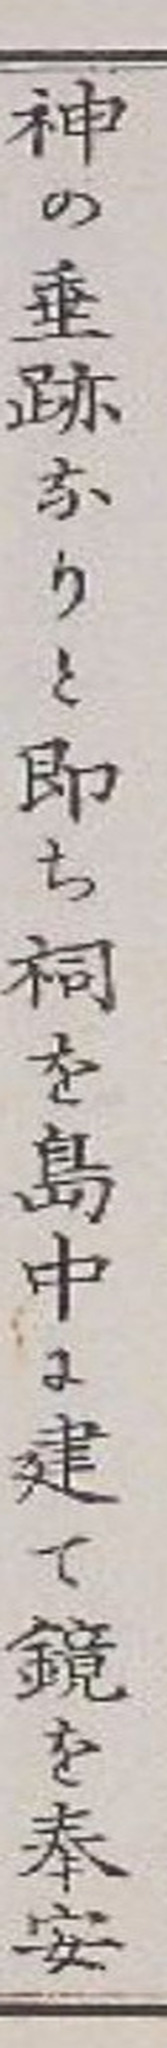神の垂跡なりと即ち祠を島中に建て鏡を奉安
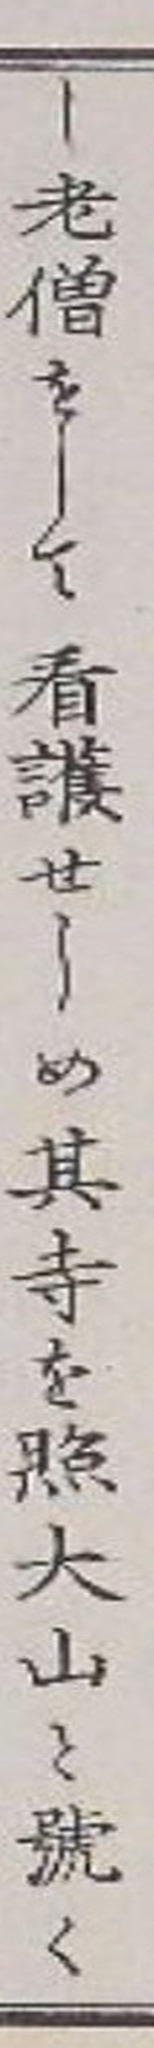し老僧をして看護せしめ其寺を照大山と号く
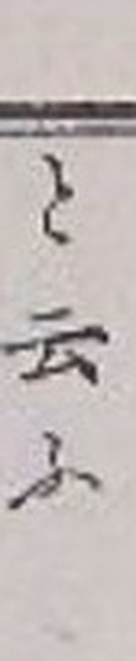と云ふ
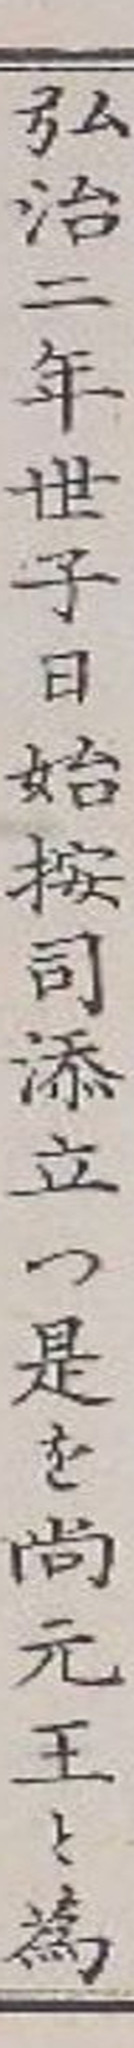弘治二年世子日始按司添立つ是を尚元王と為
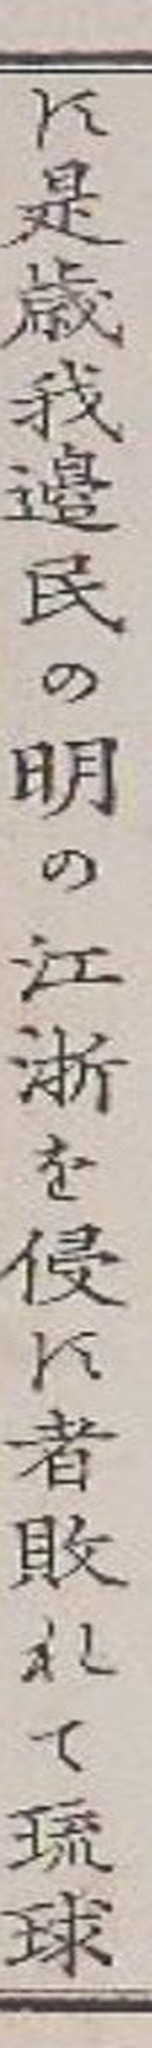す是歳我邉民の明の江浙を侵す者敗れて琉球

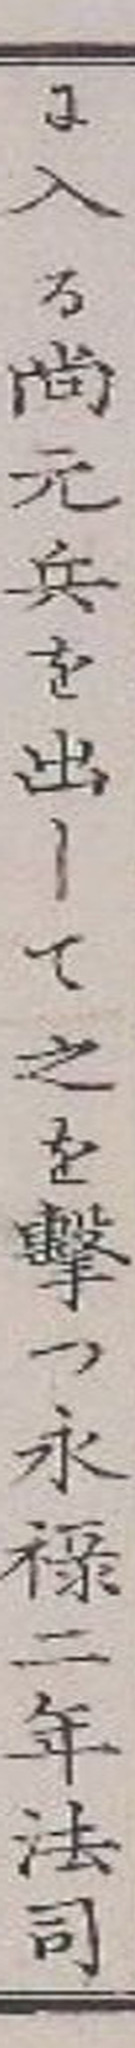に入る尚元兵を出して之を撃つ永禄二年法司
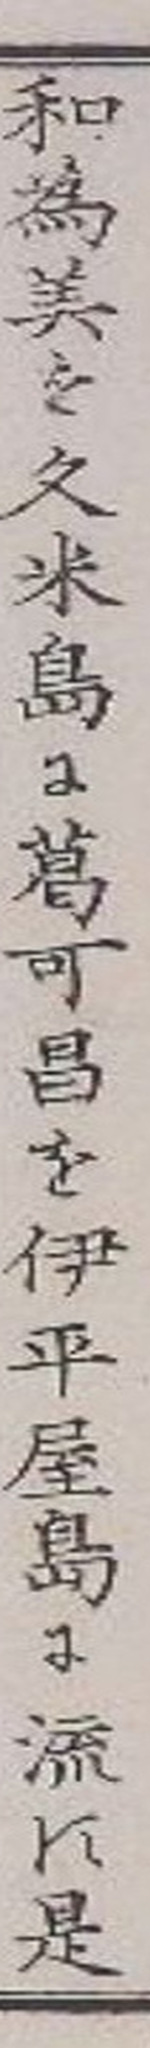和為美を久米島に葛可昌を伊平屋島に流す是
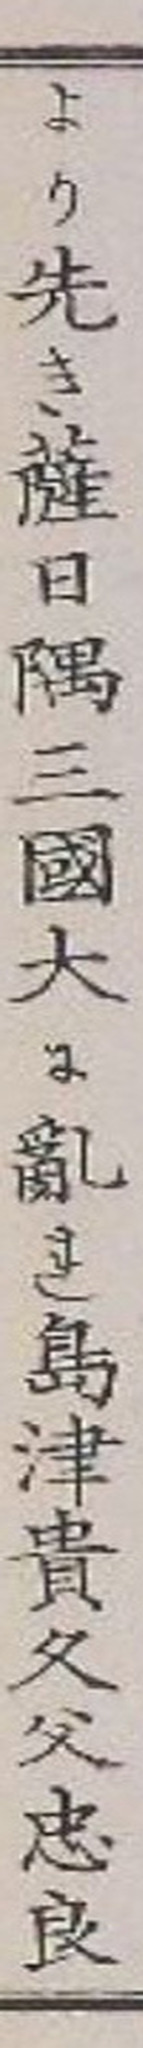より先き薩日隅三国大に乱れ島津隆久父忠良
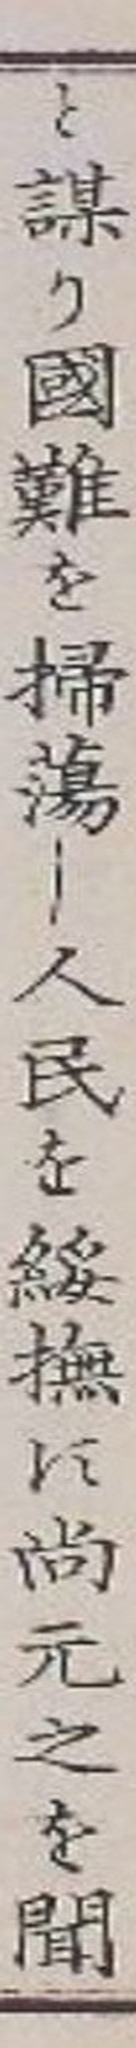と謀り国難を掃蕩し人民を綏撫す尚元之を聞
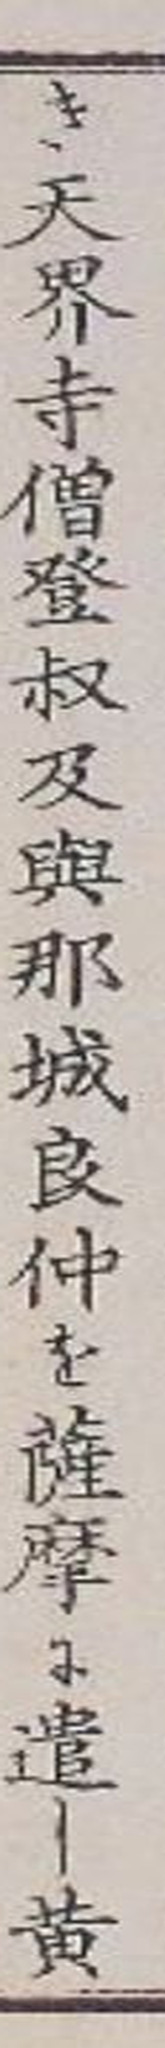き天界寺僧登叔及与那城良仲を薩摩に遣し黄
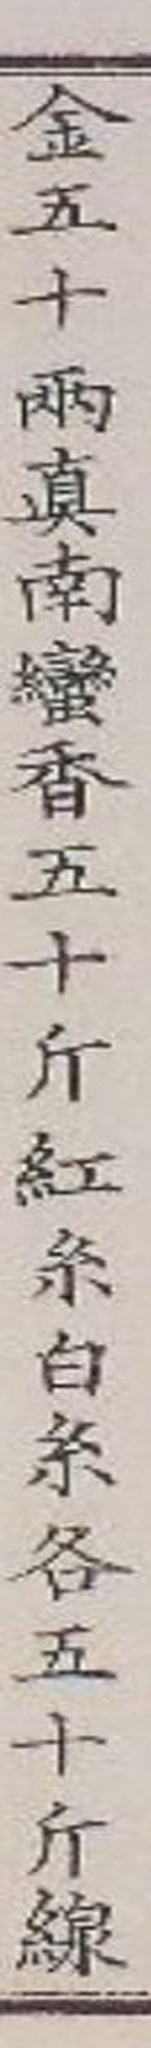金五十両真南蛮香五十斤紅糸白糸各五十斤線
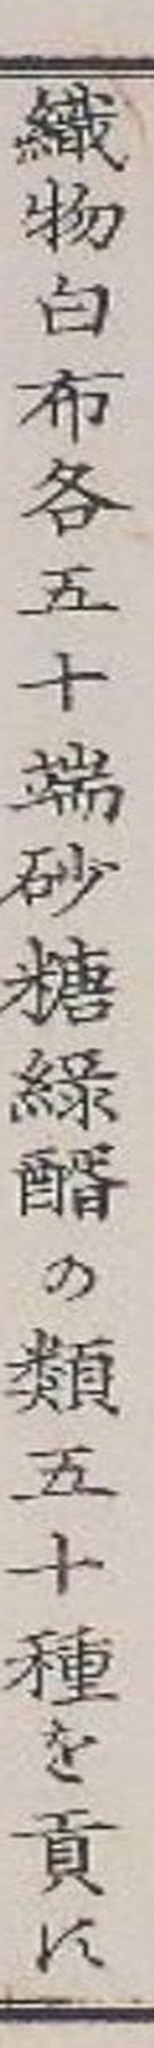織物白布各五十端砂糖緑の類五十種を貢す
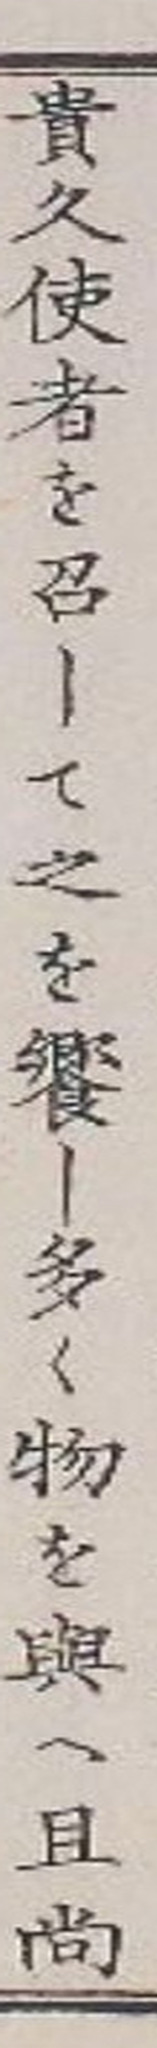貴久使者を召して之を饗し多く物を与え且尚
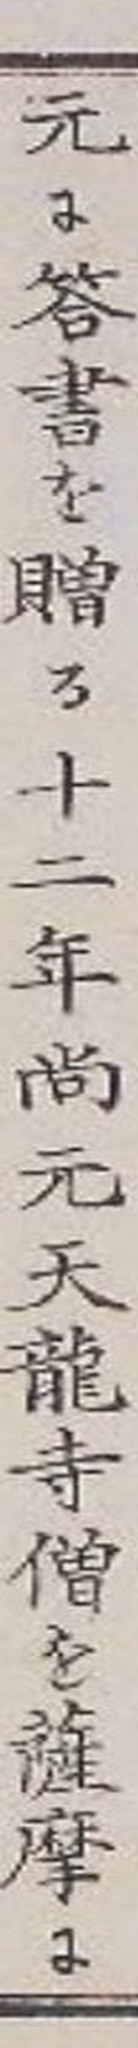元に答書を贈る十二年尚元天龍寺僧を薩摩に
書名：南島紀事 中
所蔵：University of the Ryukyus Library
